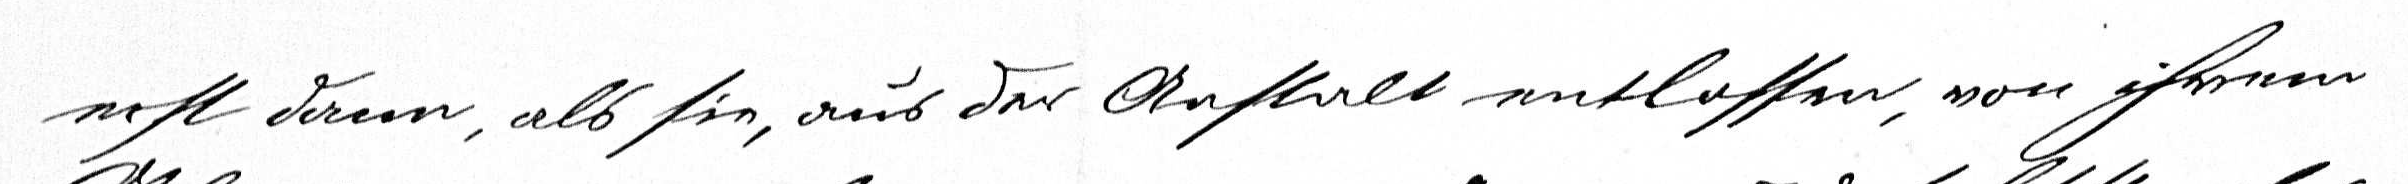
erst dann, als sie, aus der Anstalt entlassen, von ihrem
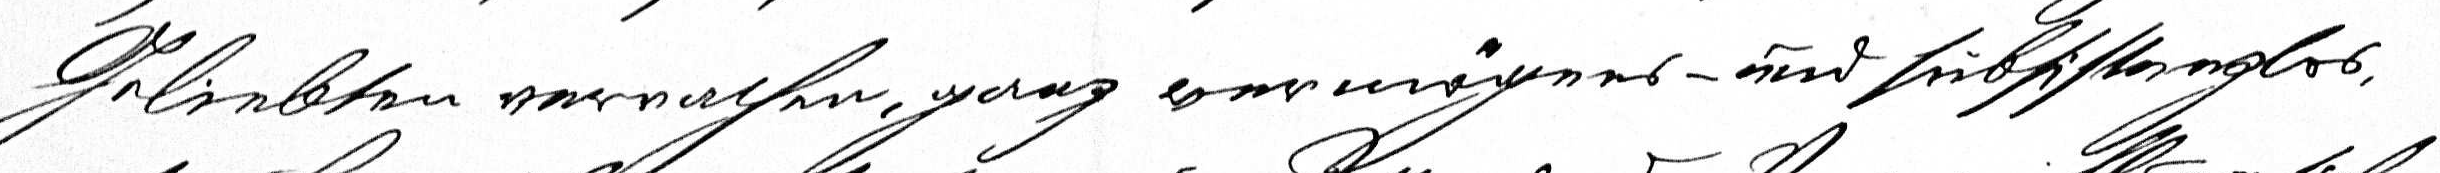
Geliebten verrathen, ganz vermögens- und substitenzlos,
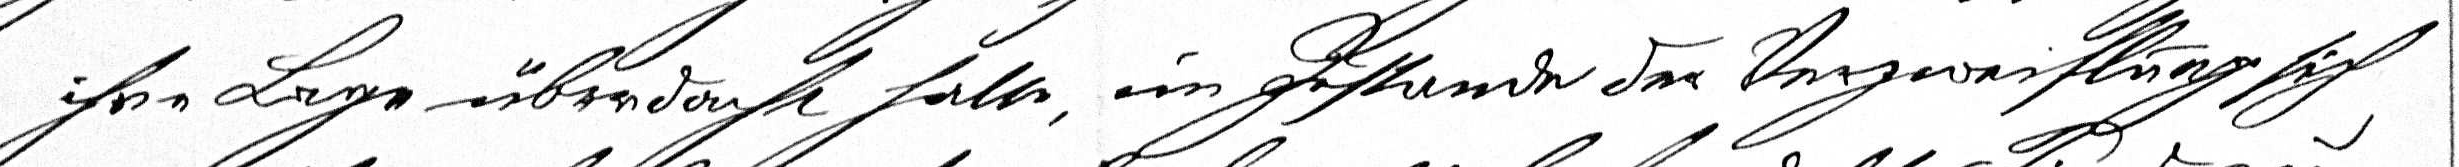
ihre Lage überdacht hatte, im Zustand der Verzweiflung sich
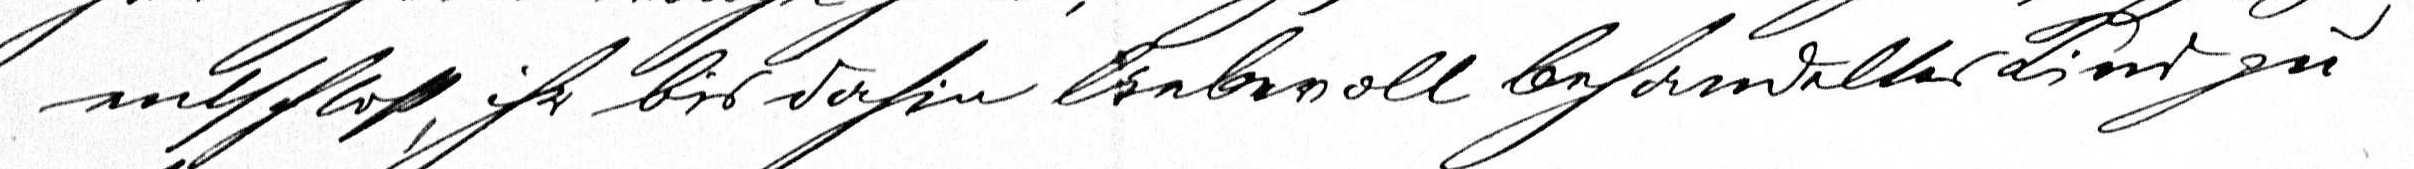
entschloß, ihr bis dahin liebvoll behandeltes Kind zu
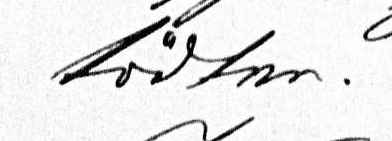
tödten.
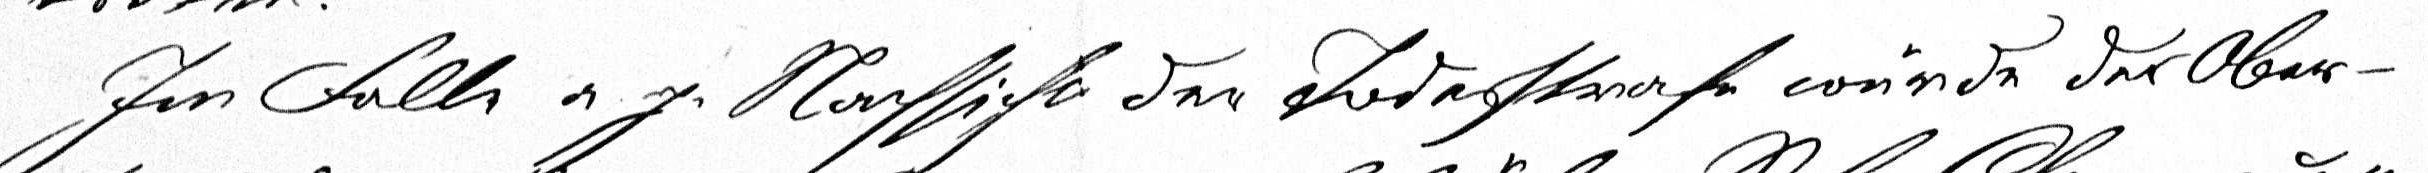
Im Falle a.g. Nachsicht der Todesstrafe würde der Ober¬
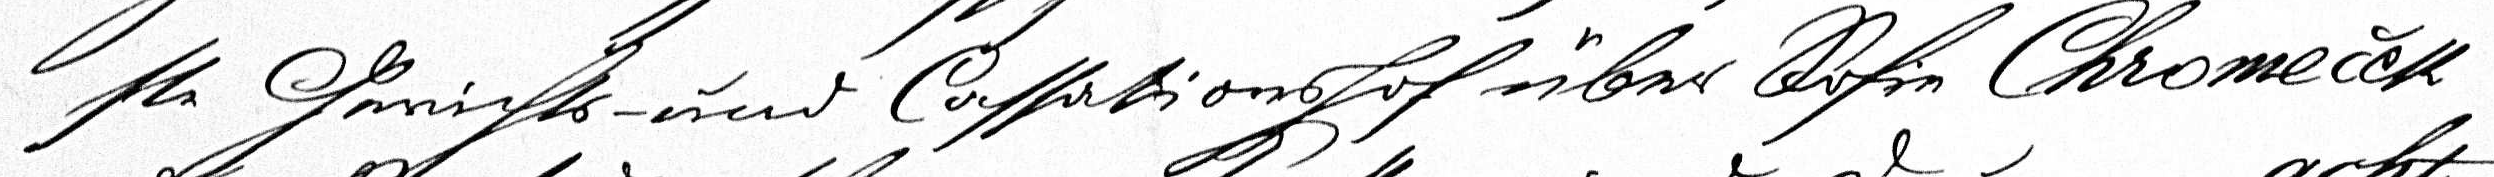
ste Gerichts- und Cassationshof über Sofie Chromeček
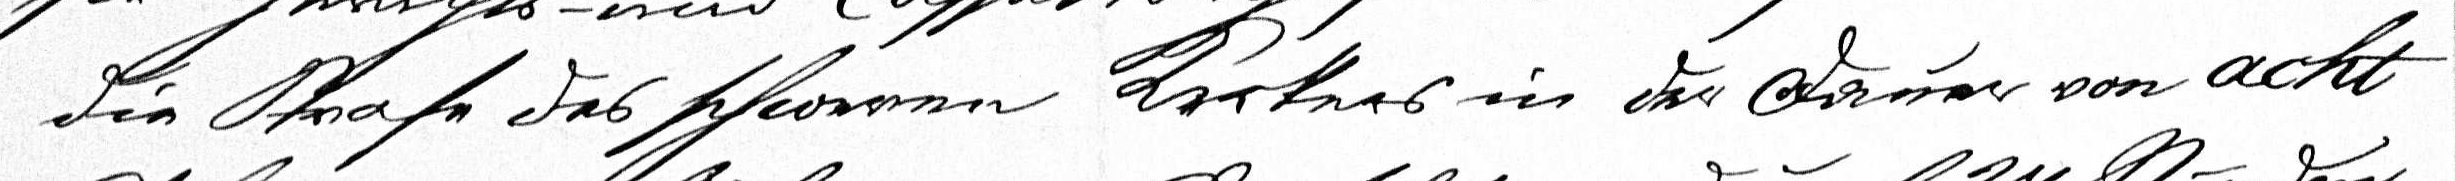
die Strafe des schweren Kerkers in der Dauer von acht
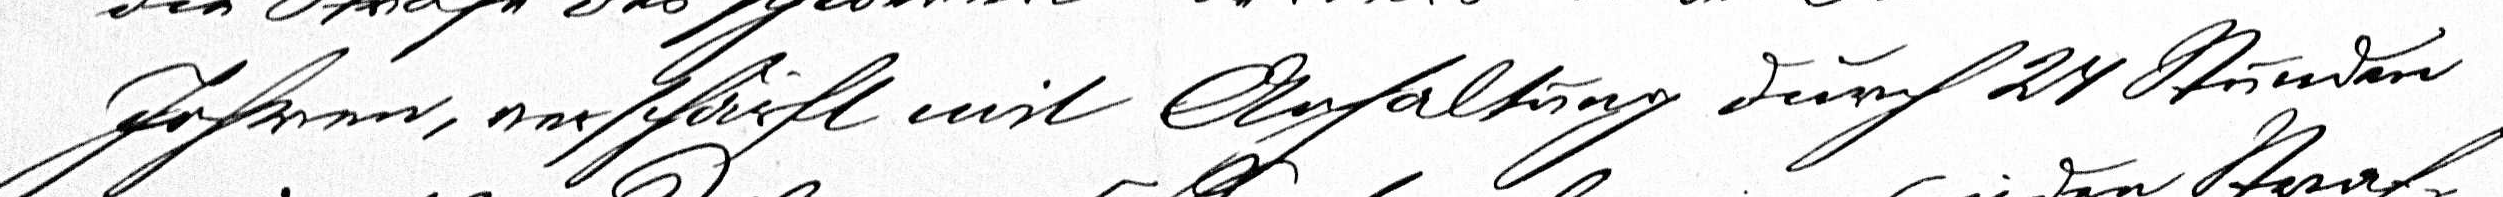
Jahren, verschärft
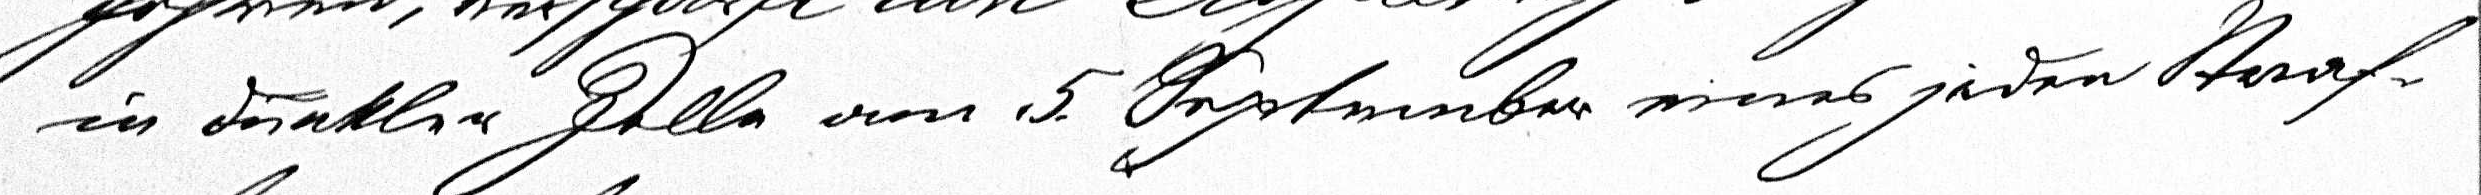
am 5. September eines jeden Straf¬
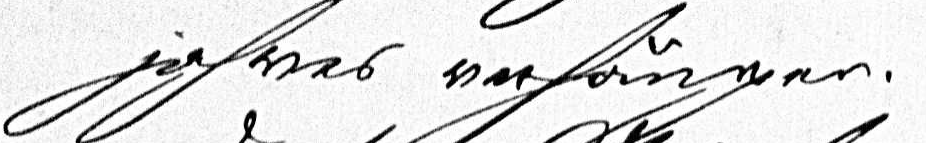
jahres verhängen.
